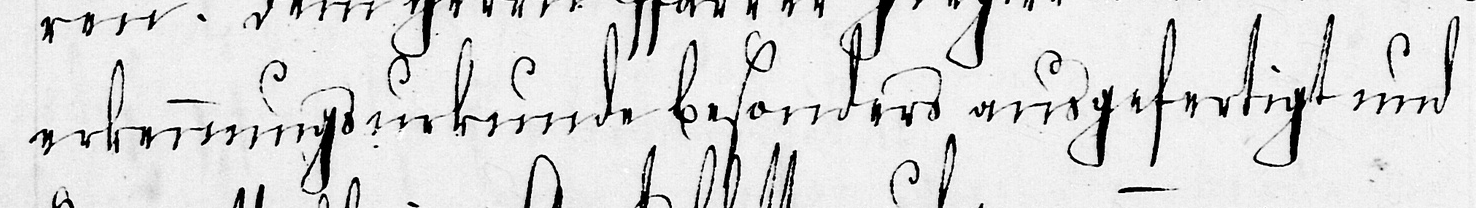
erkennungsurkunde besonders ausgefertigt und
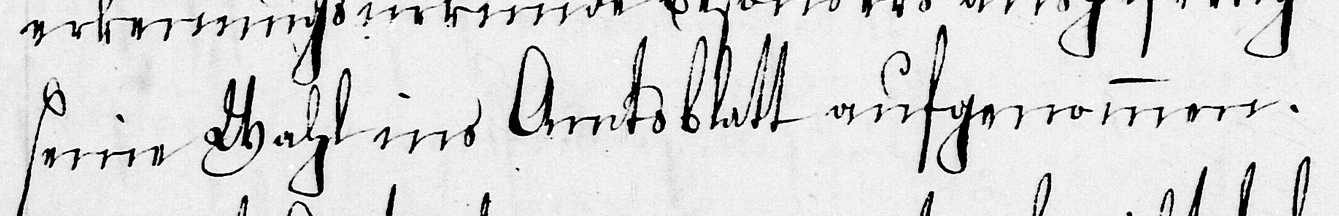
seine Wahl ins Amtsblatt aufgenommen.
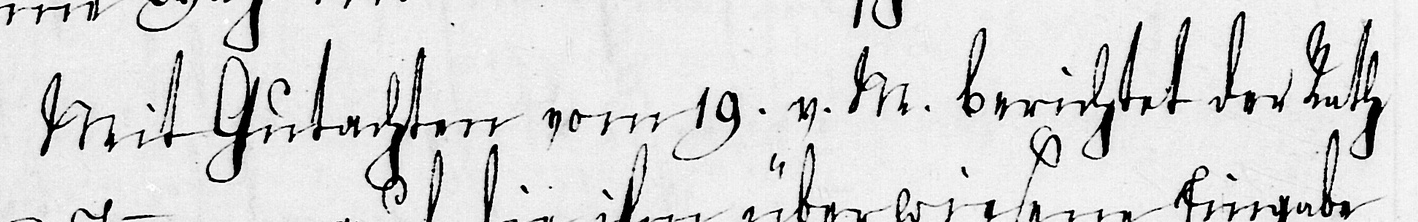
Mit Gutachten vom 19. v. M. berichtet der Rath
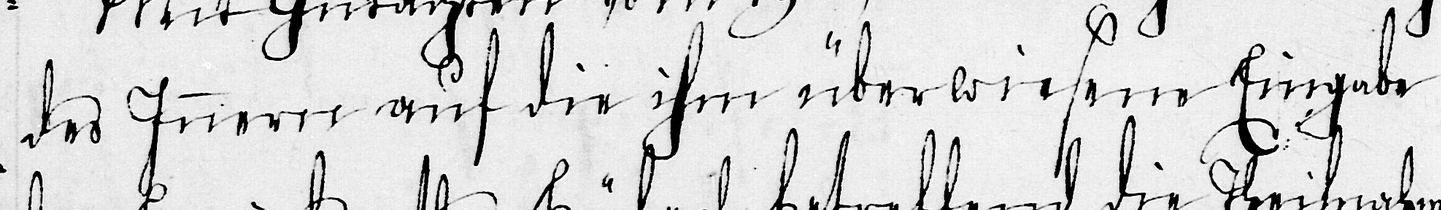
des Innern auf die ihm überwiesene Eingabe
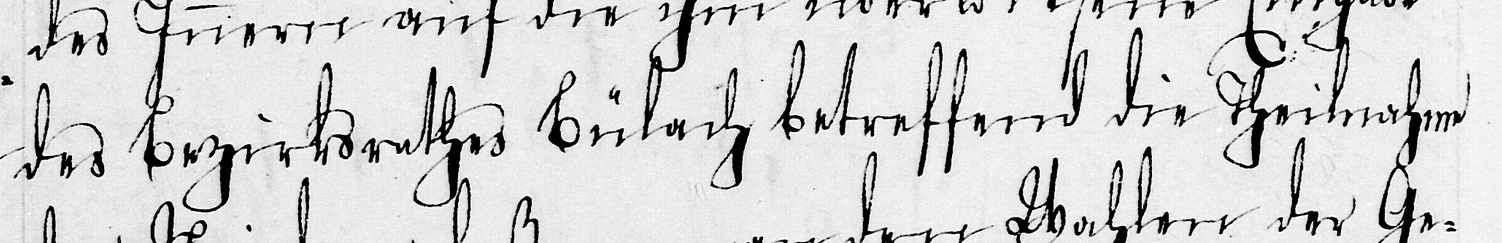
des Bezirksrathes Bülach betreffend die Theilnahme
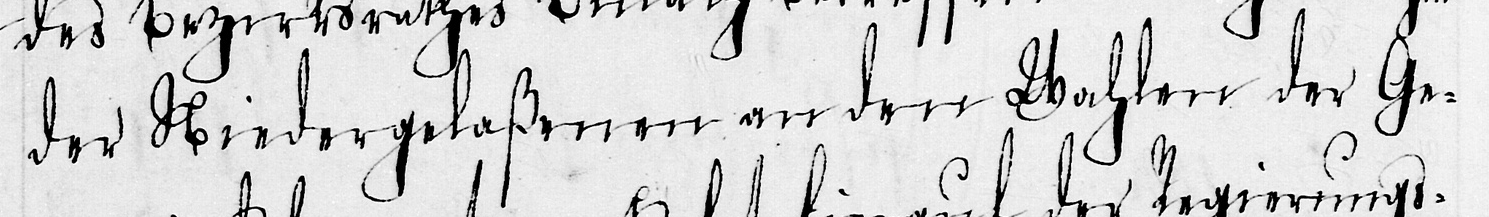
der Niedergelaßenen an den Wahlen der Ge¬
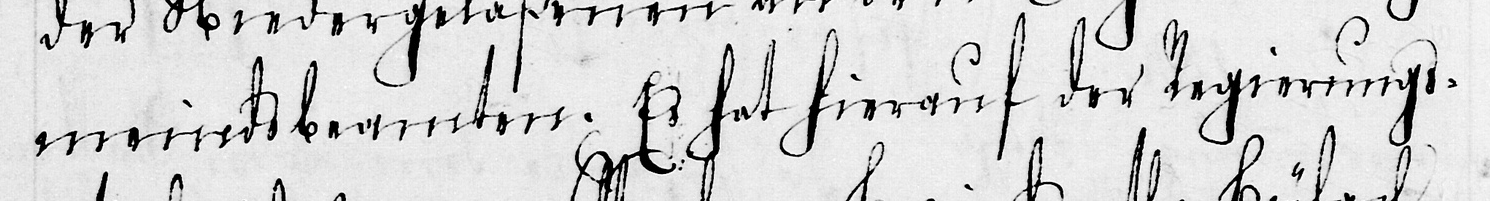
meindsbeamten. Es hat hierauf der Regierungs¬
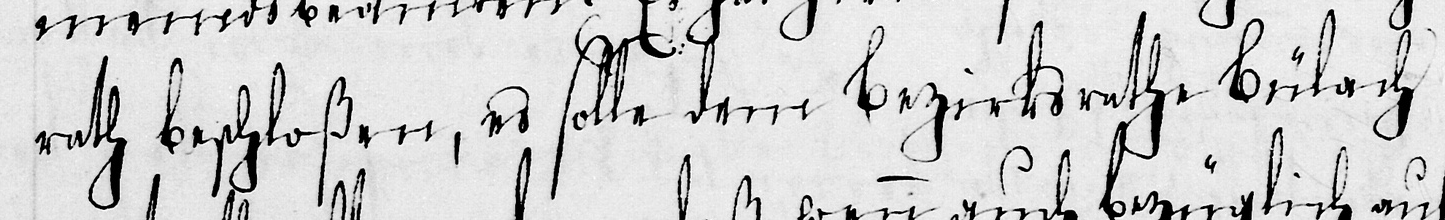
rath beschloßen, es solle dem Bezirksrathe Bülach
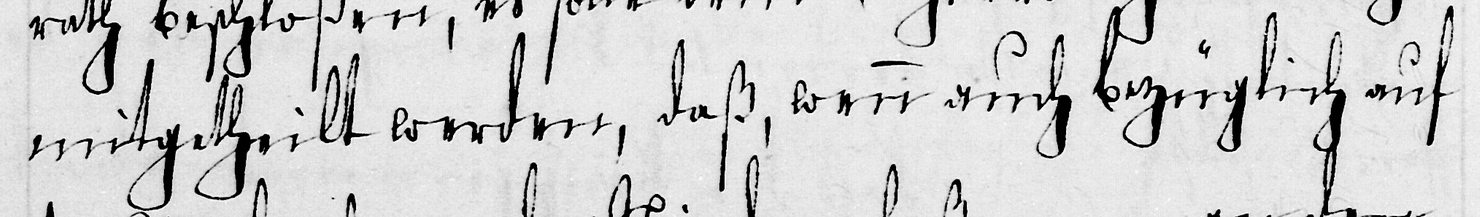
mitgetheilt werden, daß, wenn auch bezüglich auf
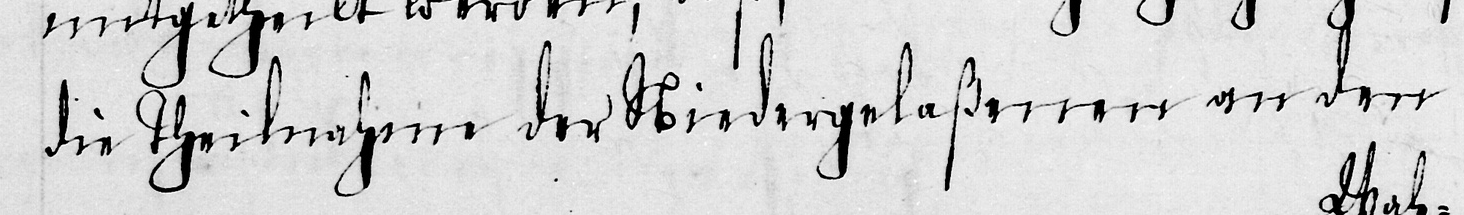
die Theilnahme der Niedergelaßenen an den
